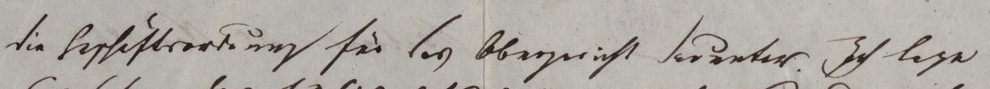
die Geschäftsordnung für das Obergericht darunter. Ich lege
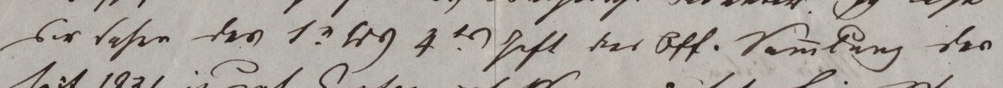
Dir daher des 1n Bds 4tes Heft der Off. Sammlung der
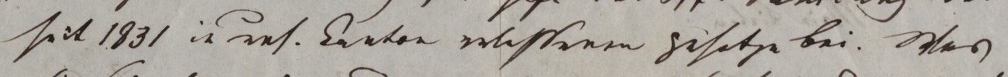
seit 1831 in uns. Canton erlassenen Gesetze bei. Was
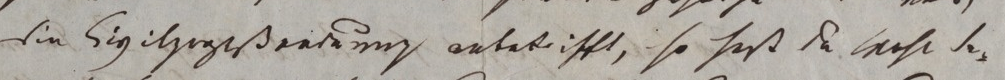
die Civilprozeßordnung anbetrifft, so hast Du wohl da-
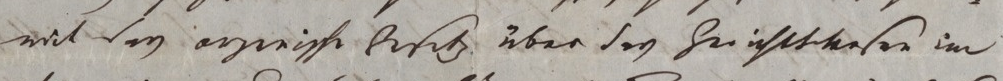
mit das organische Gesetz über das Gerichtswesen im
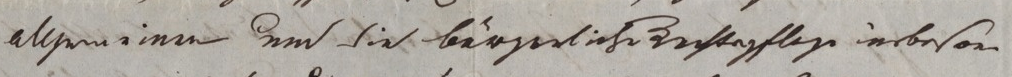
allgemeinen und die bürgerliche Rechtspflege insbeson-
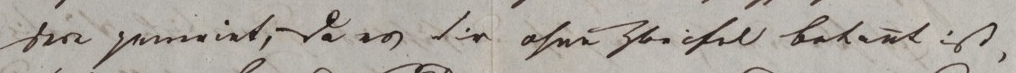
dere gemeint, da es Dir ohne Zweifel bekannt ist,
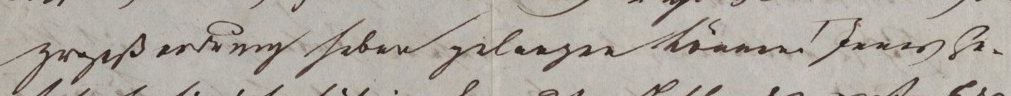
prozeßordnung haben gelangen können! Jenes Ge-
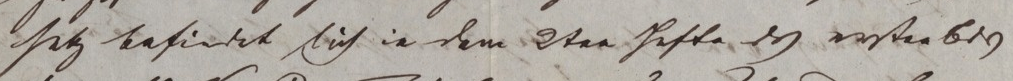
setz befindet sich in dem 2ten Hefte des ersten Bds
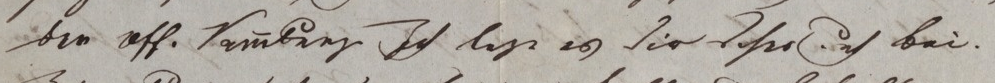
der off. Sammlung. Ich lege es Dir daher auch bei.
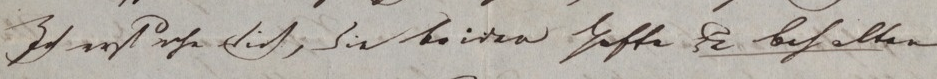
Ich ersuche Dich, die beiden Hefte zu behalten.
